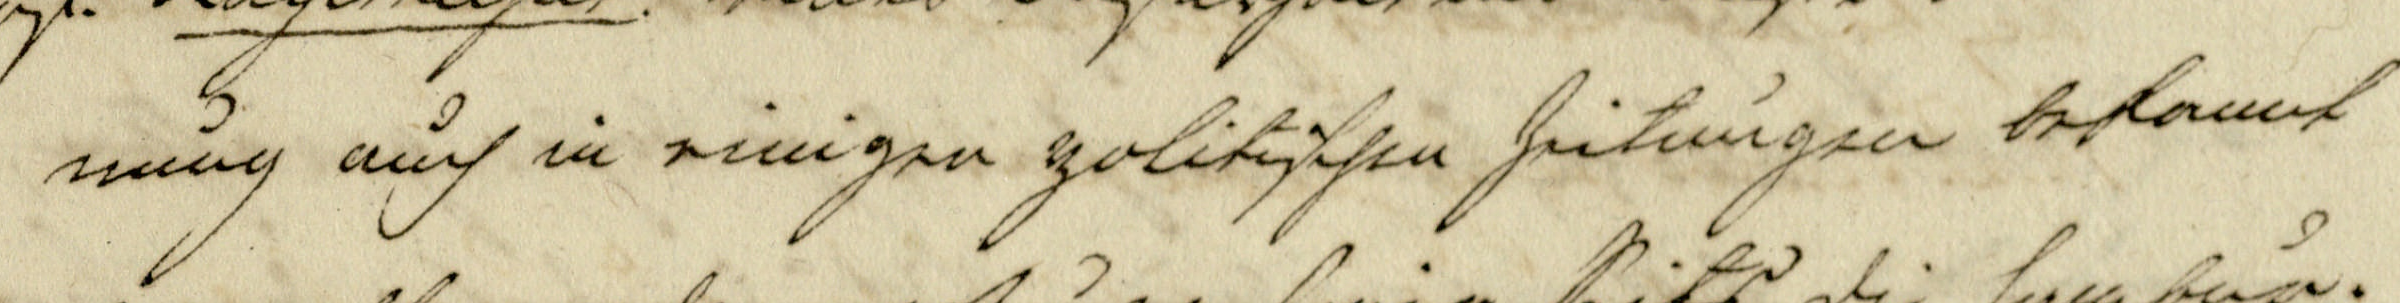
nung auch in einigen politischen Zeitungen bekannt
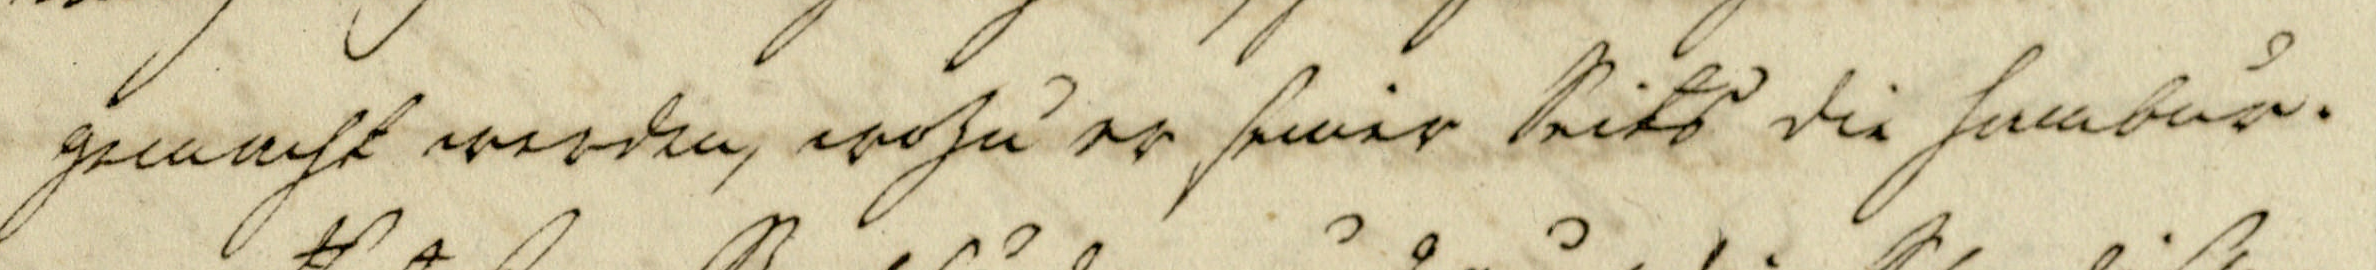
gemacht werden, wozu er seiner Seits die Hambur¬
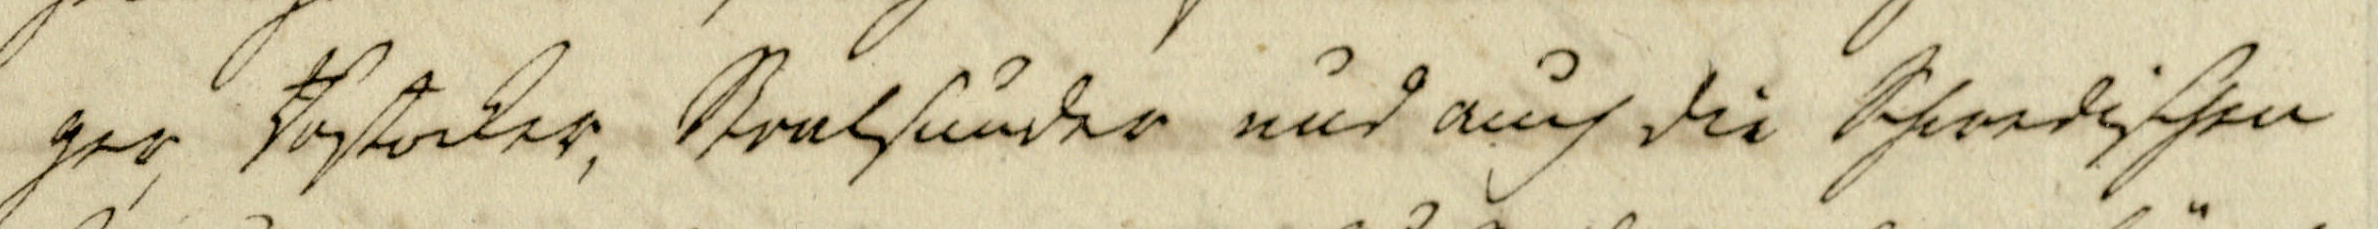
ger, Rostocker, Stralsunder und auch die Schwedischen
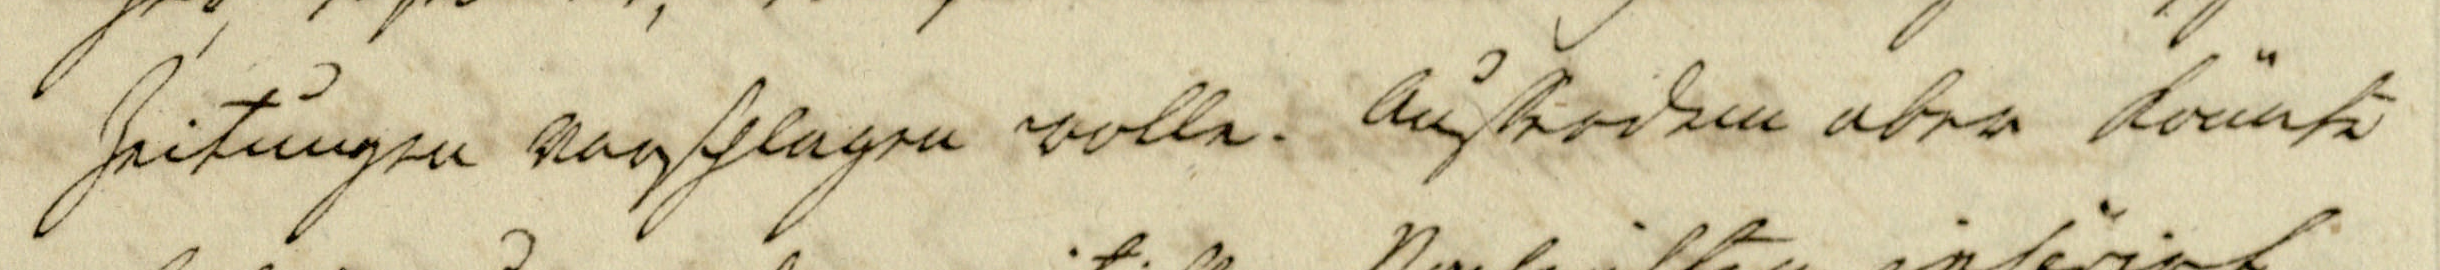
Zeitungen vorschlagen wolle. Ausserdem aber könnte
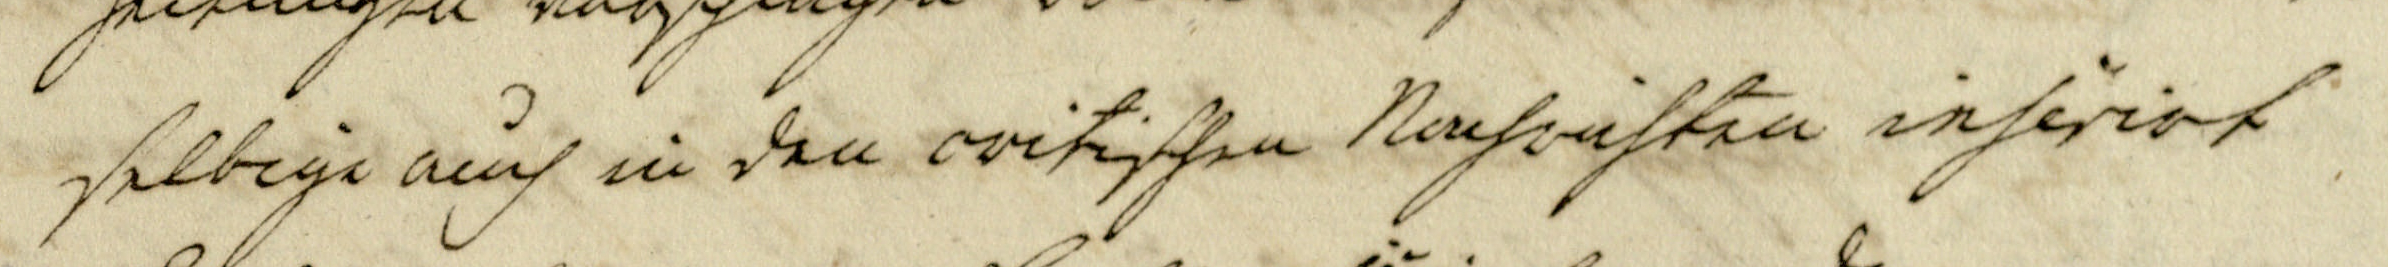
selbige auch in den critischen Nachrichten inserirt
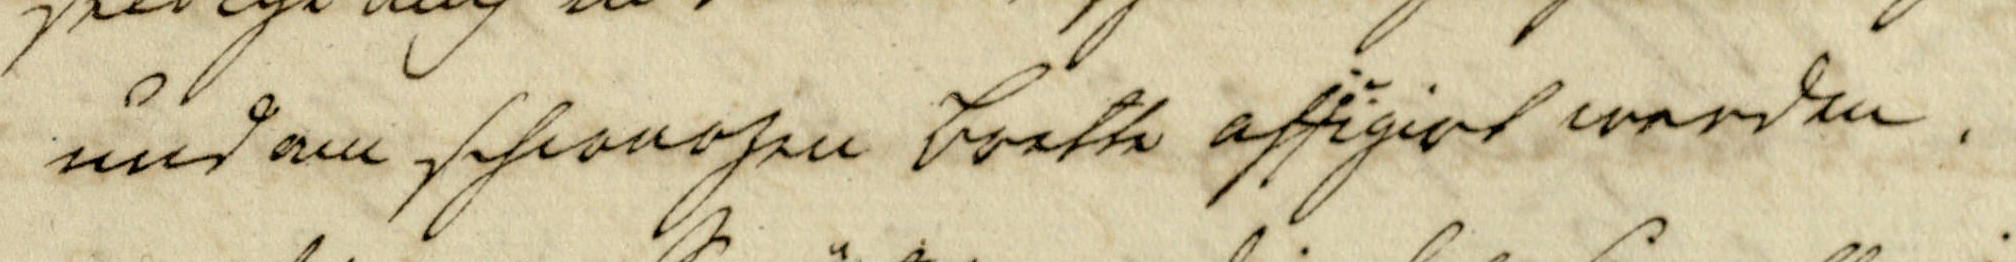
und am schwarzen Brette affigirt werden.
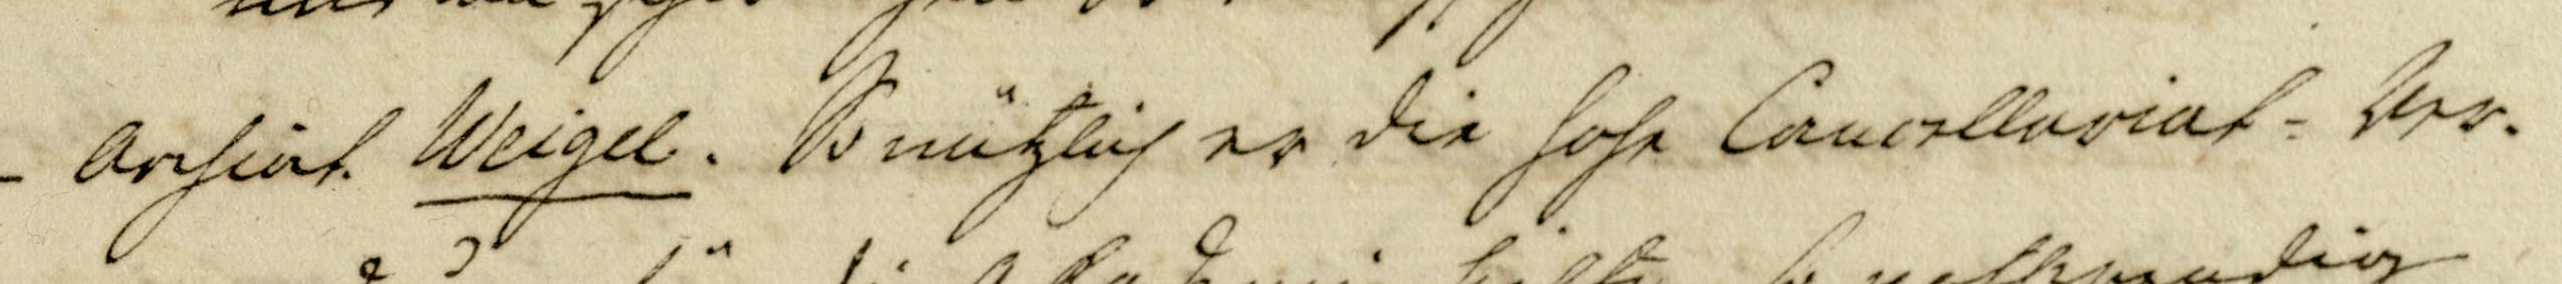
Archiat. Weigel. So nützlich er die hohe Cancellariat- Ver¬
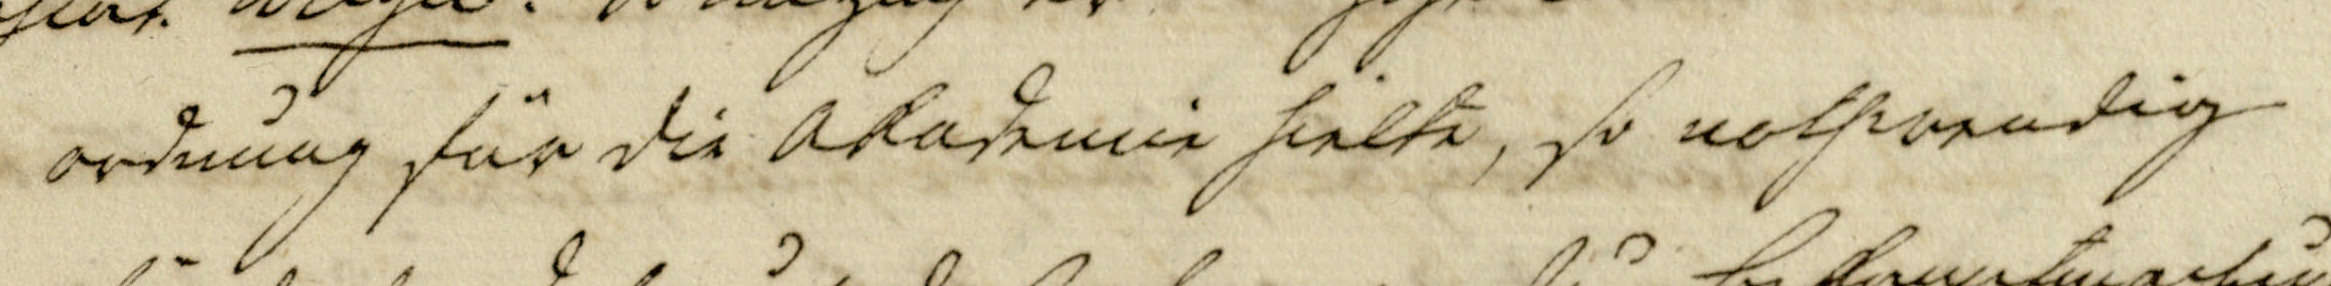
ordnung für die Akademie hielte, so nothwendig
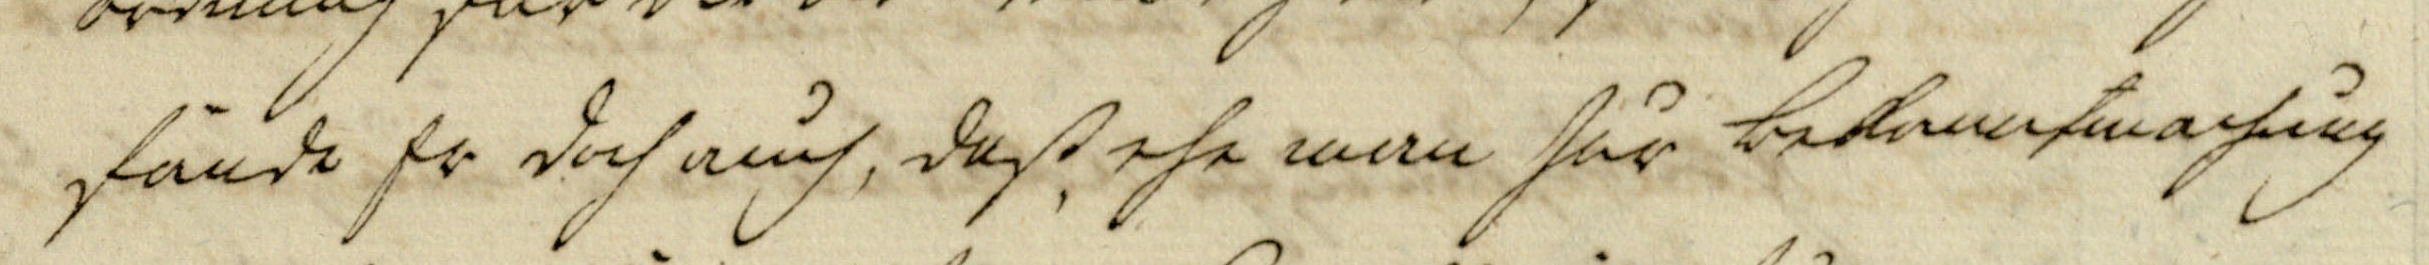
fände Er doch auch, daß ehe man zur Bekanntmachung
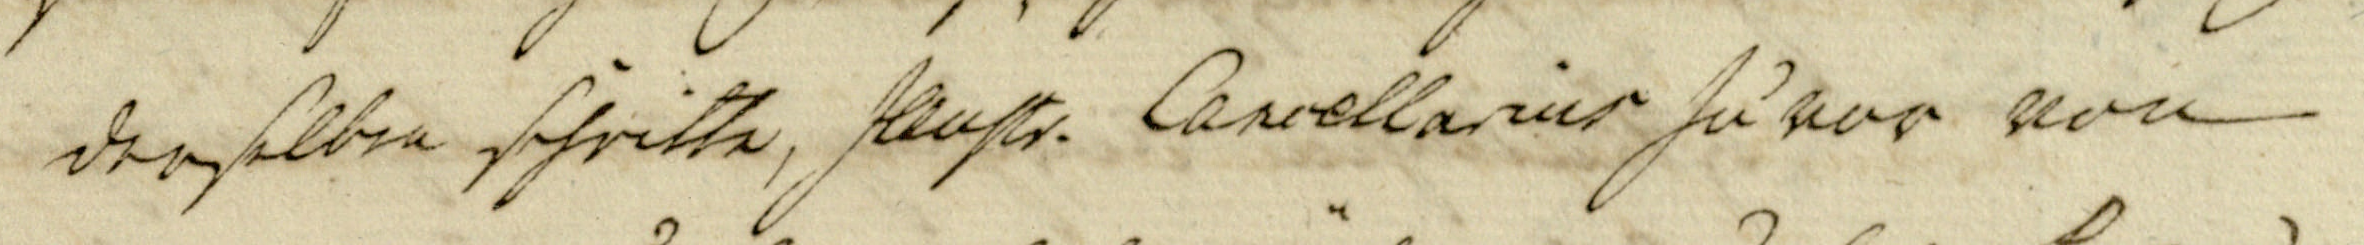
derselben schritte, Illustr. Cancellarius zu vor von
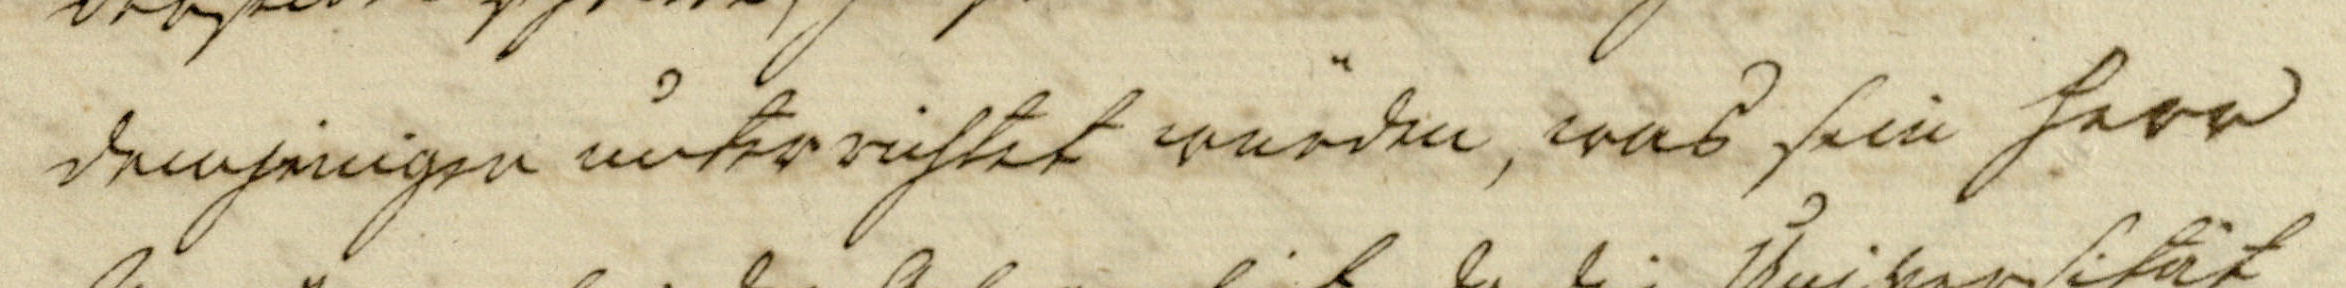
demjenigen unterrichtet würden, was sein Herr
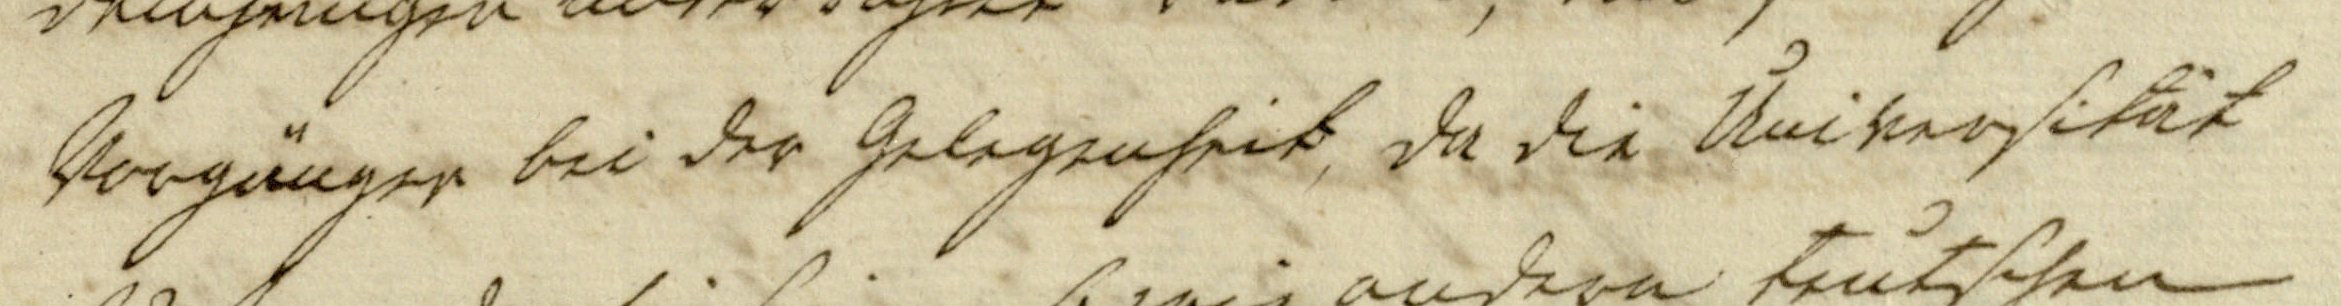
Vorgänger bei der Gelegenheit, da die Universität
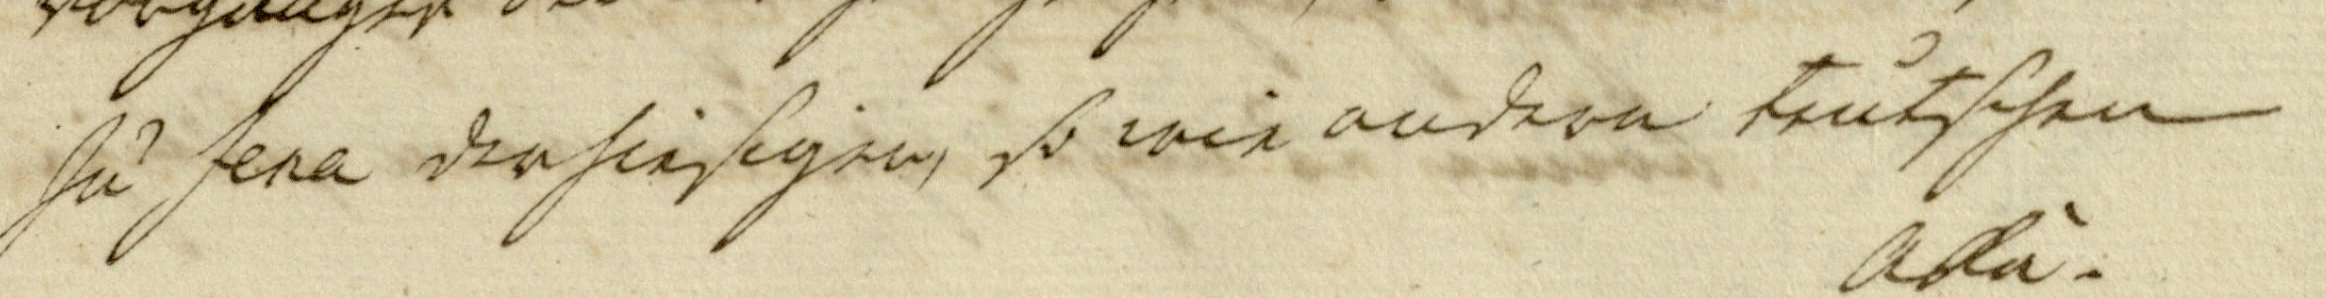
zu Jena der hiesigen, so wie andern teutschen
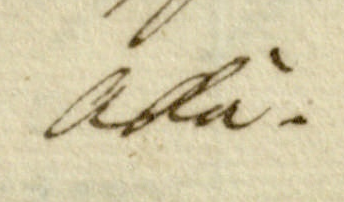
Aka¬
